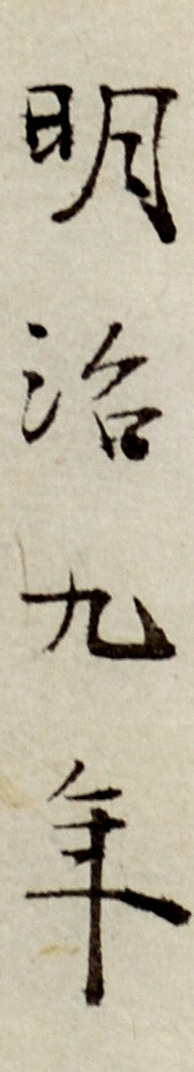明治九年
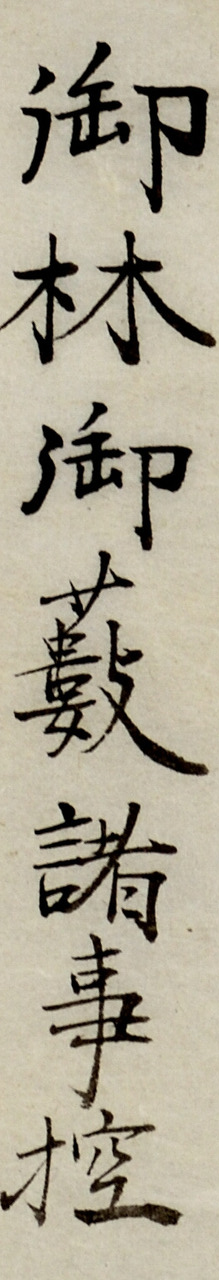御林御薮諸事控
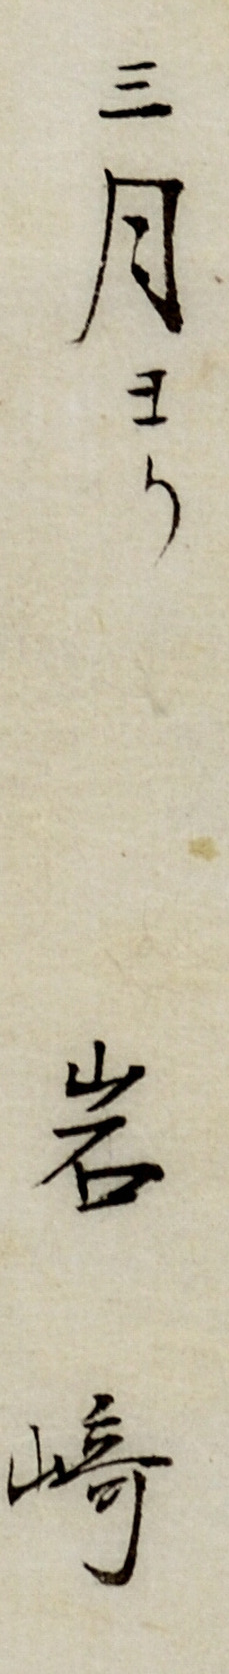三月ヨリ岩崎

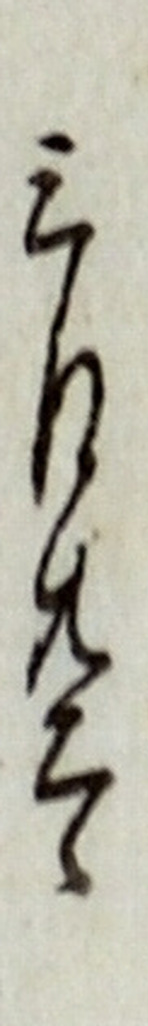八月廿九日
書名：御林御藪諸事控
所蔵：伊那市立高遠町図書館・合同会社AMANE
